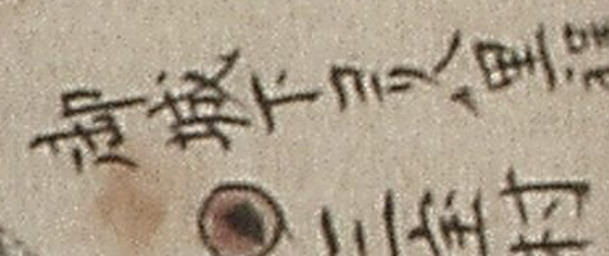御城下ヨリ八里程
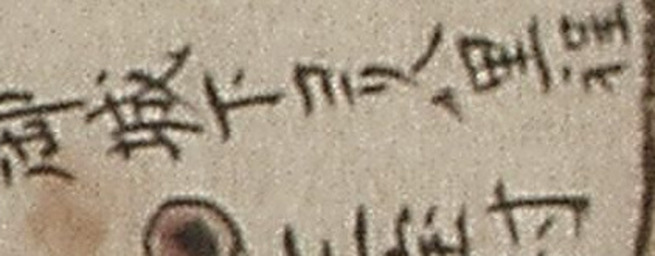御城下ヨリ八里程
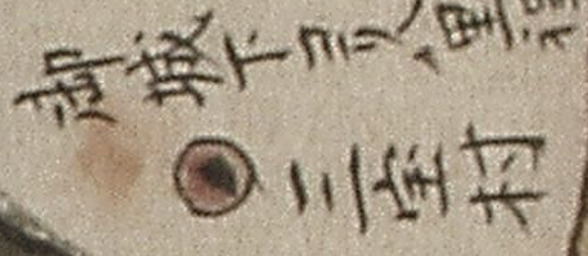●三宝村
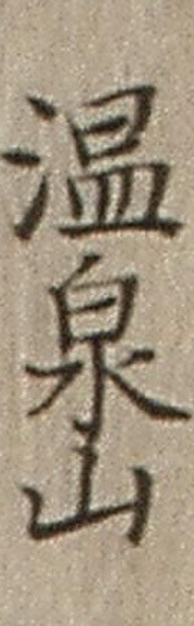温泉山
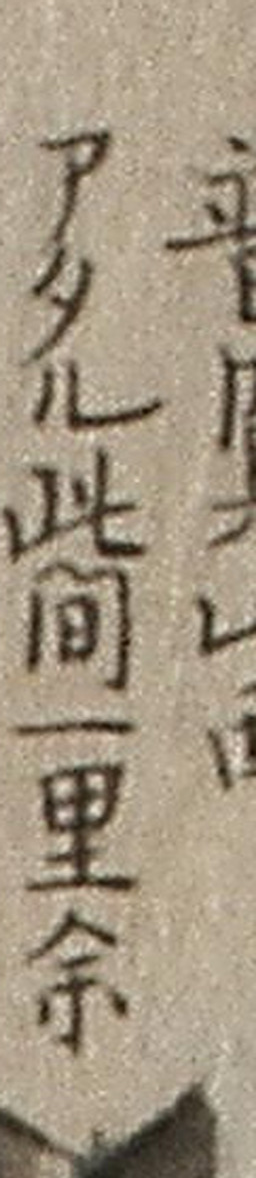アタル此間一里余
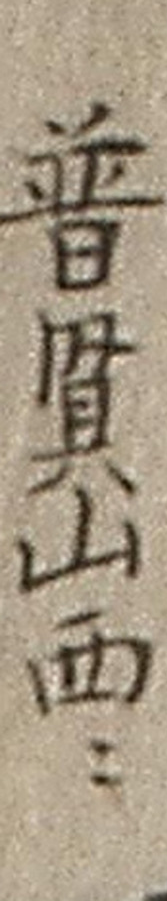普賢山西二
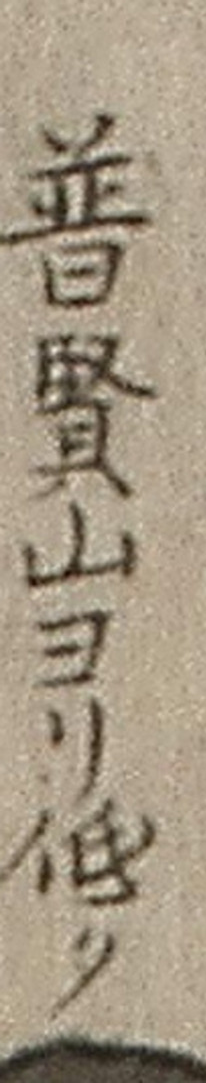普賢山ヨリ低ク
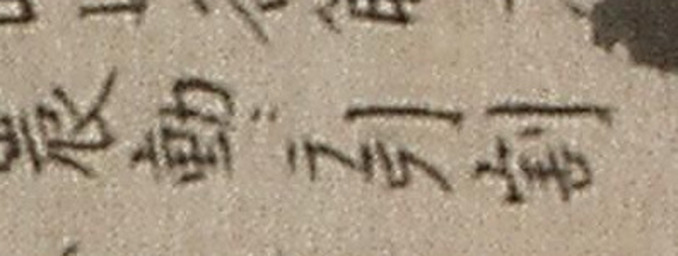震動ニテ引割
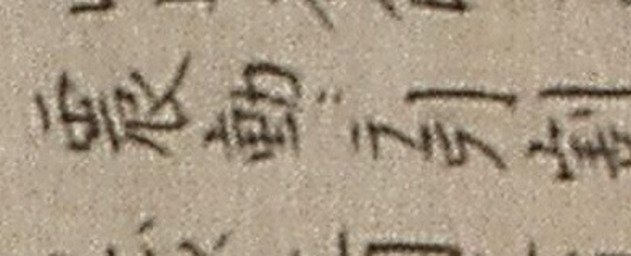震動ニテ引割
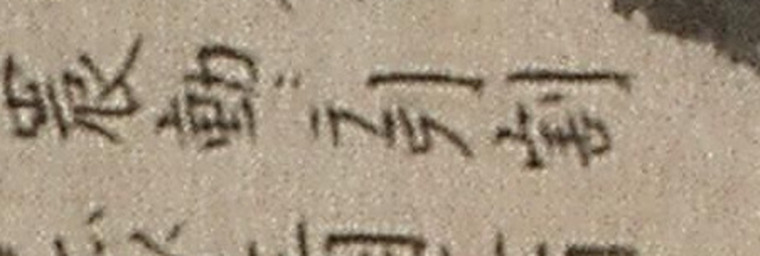震動ニテ引割
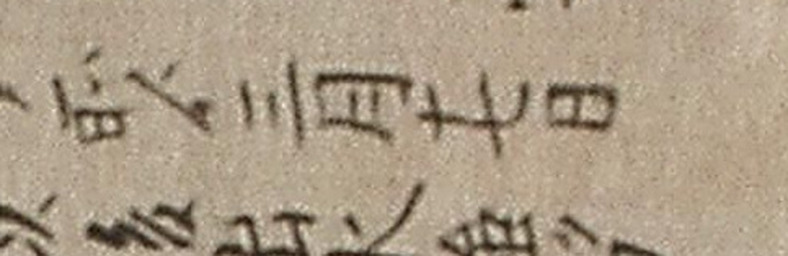候所ゟ三月十七日
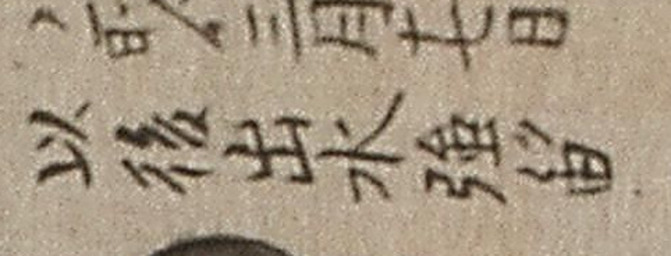以後出水強ク候由
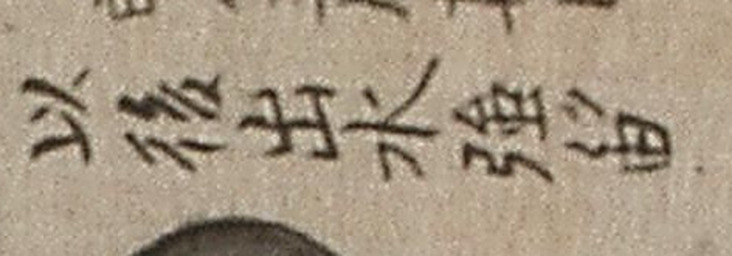以後出水強ク候由
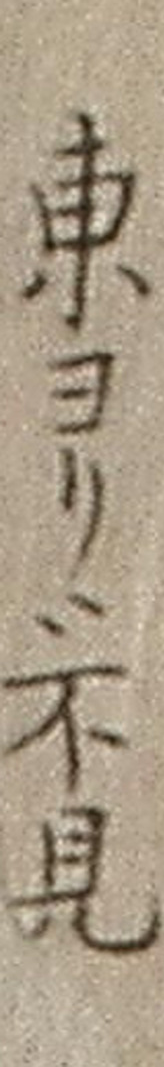東ヨリハ不見
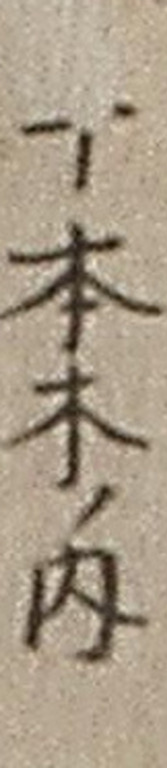千本木ノ内
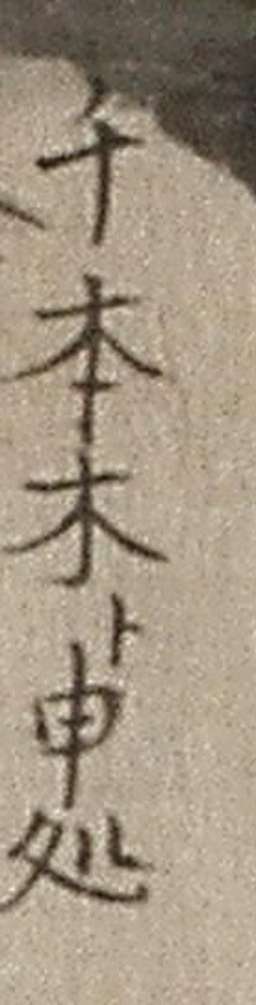千本木ㇳ申処
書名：太平秘録抜書　浅間山燒及普賢山崩
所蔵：東京大学地震研究所図書室 Earthquake Research Institute Library, The University of Tokyo, JAPAN
